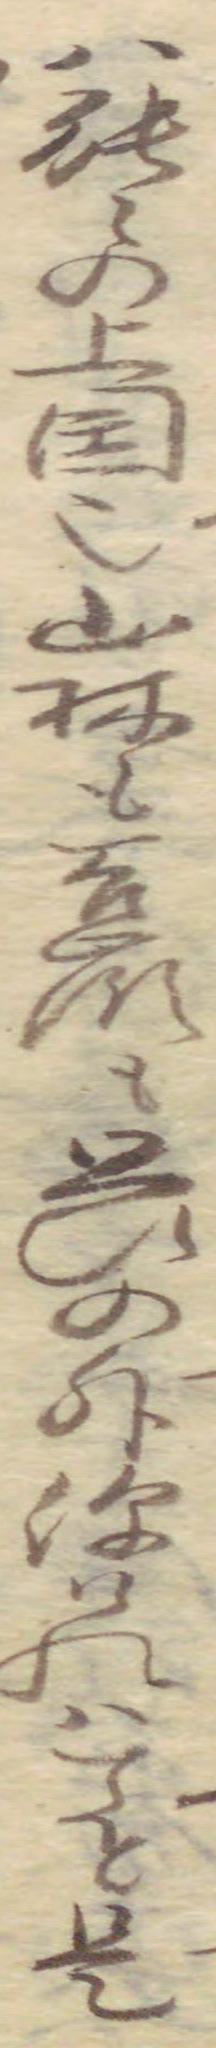は能〻の上国也山林も谷崩も思ひの外深けれはこそ是
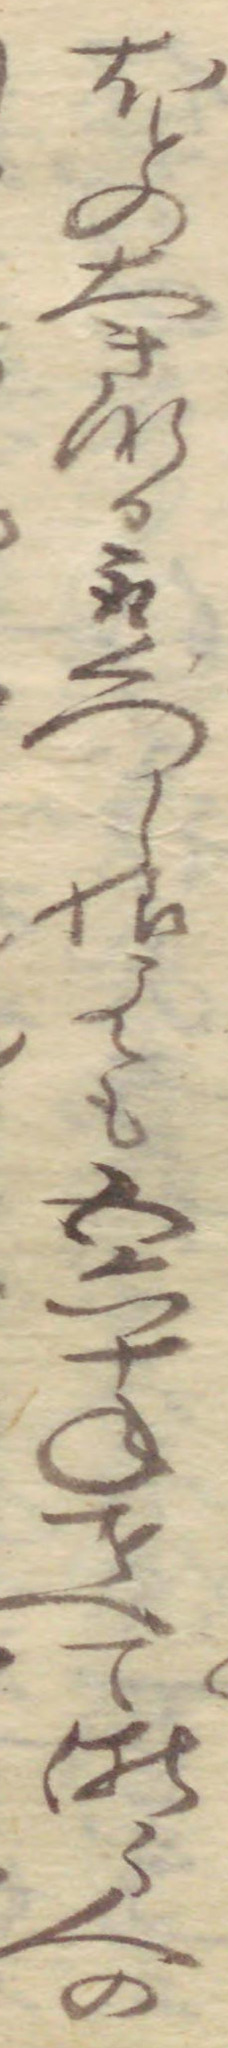ほとの大きなる取くつし様ニても五六十年をへて漸く人の
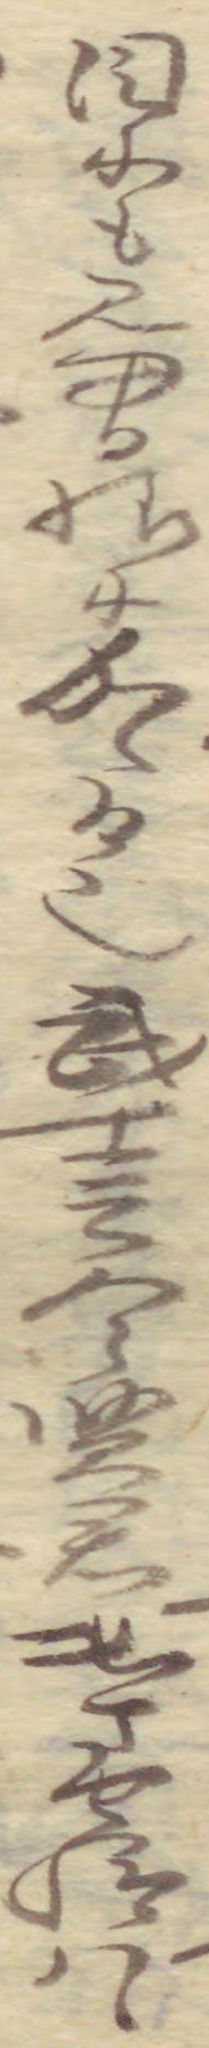目にも見ゆる様に成たる也武士云今賢君出させ給はゝ
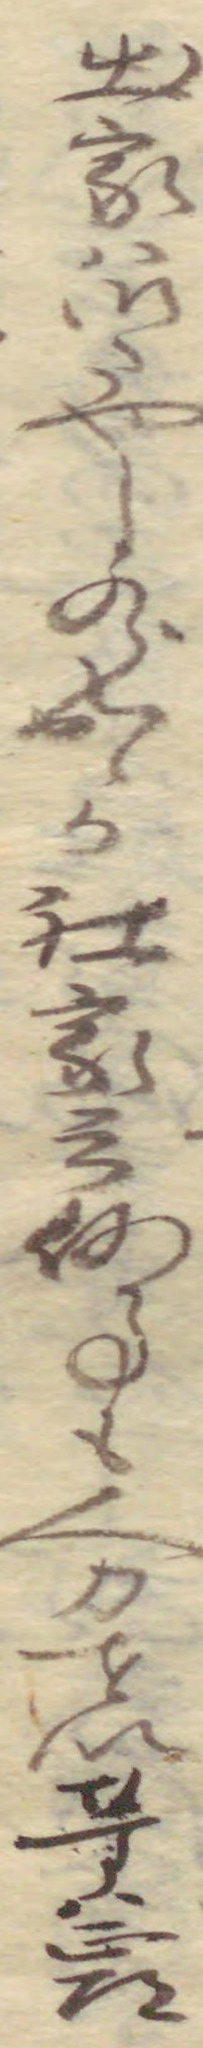出家は御たやし可被成候か社家云何事も人力を以なすは正道
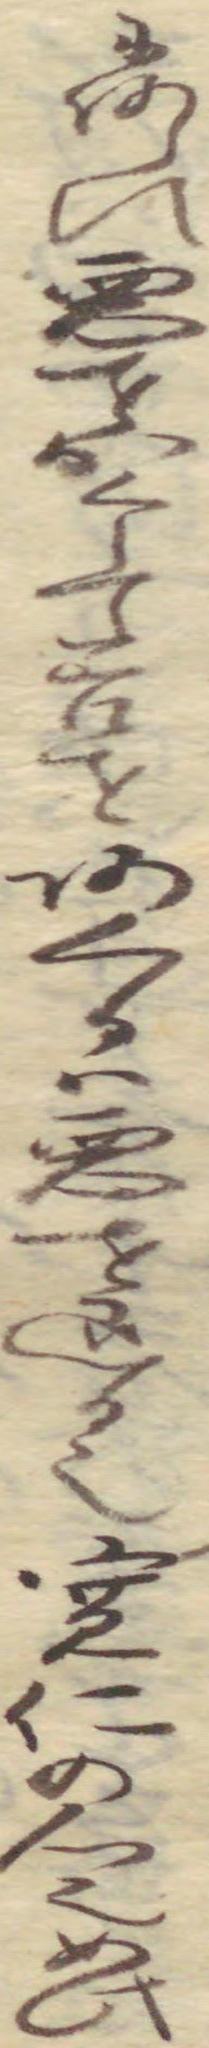にあらす悪をかくして善をあくるは悪を退る也寛仁の心也如此
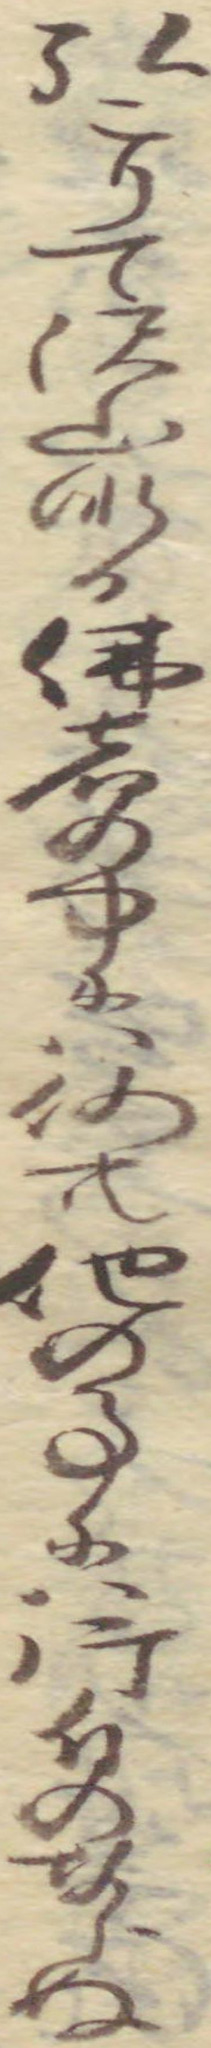弘こりて沢山なる仏者の中には何共他の事には片付のならぬ
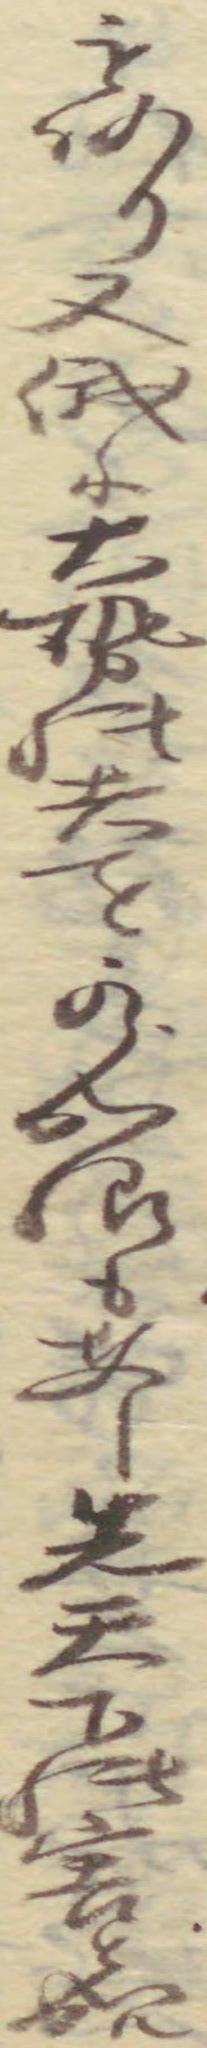もあり又俄に大勢の者を可被成様もなし先天下の害と成ル
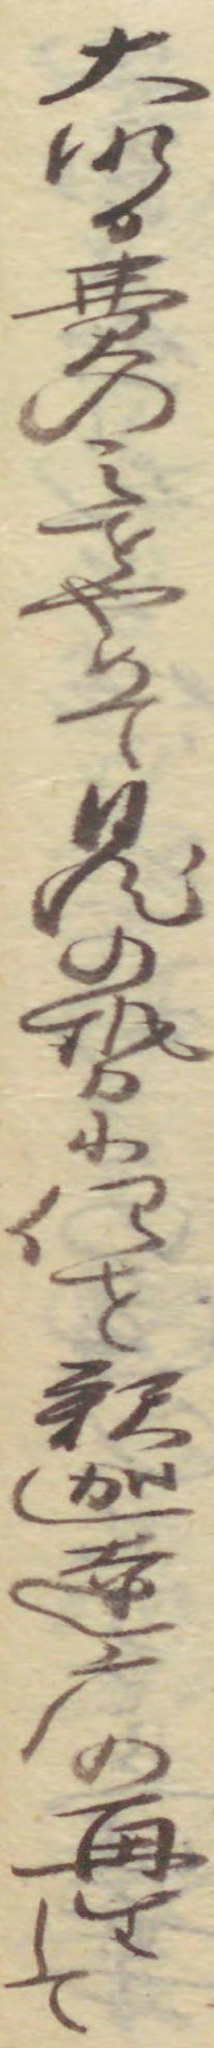大なる費のみをやめて自然の勢に任せ釈迦達磨の再生して
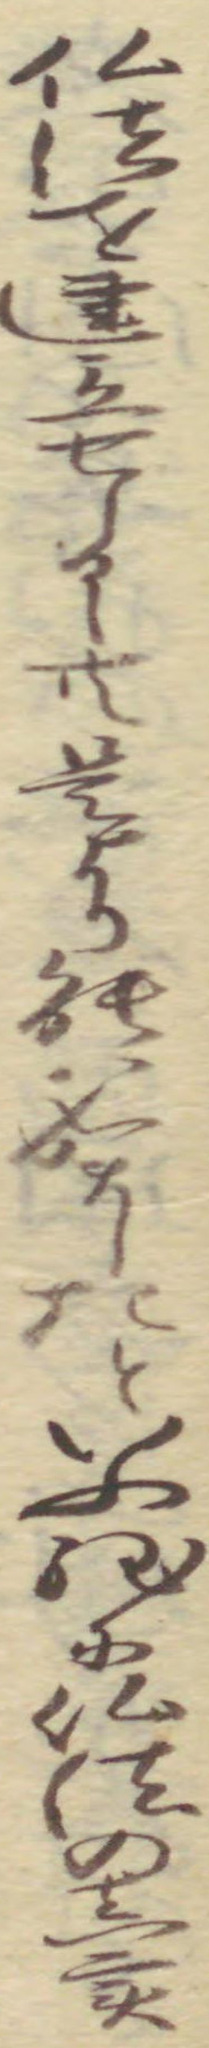仏法を建立せらるゝ共是より能は成ましきといふ程に仏法の真実
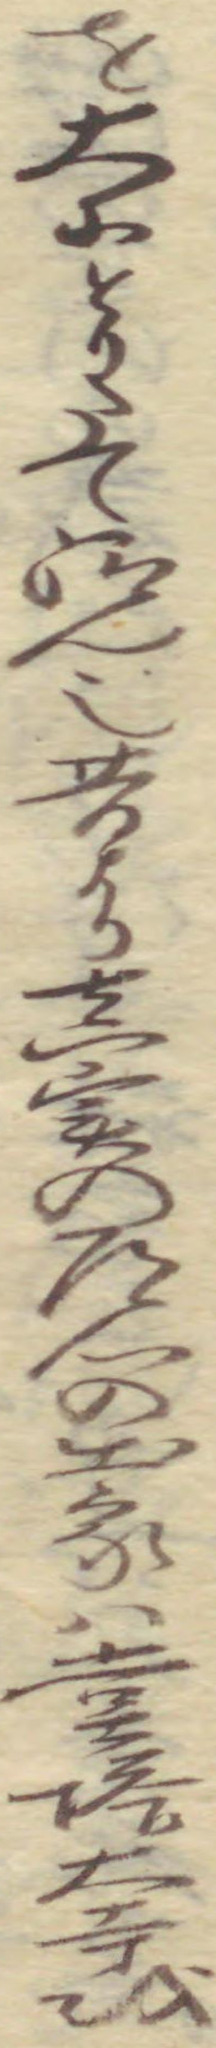を大にとりたて給ん也昔より真実の道心の出家は堂塔大寺を
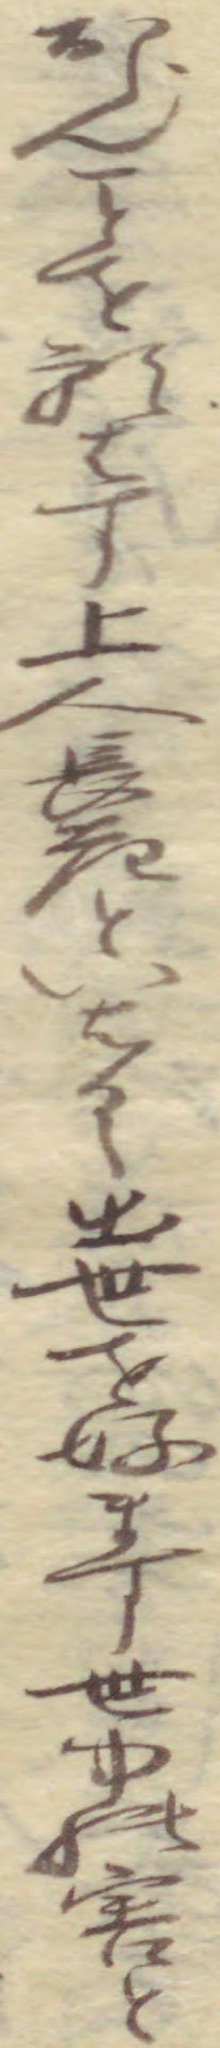おらんことを願はす上人長老といはるゝ出世を好ます世中の害と
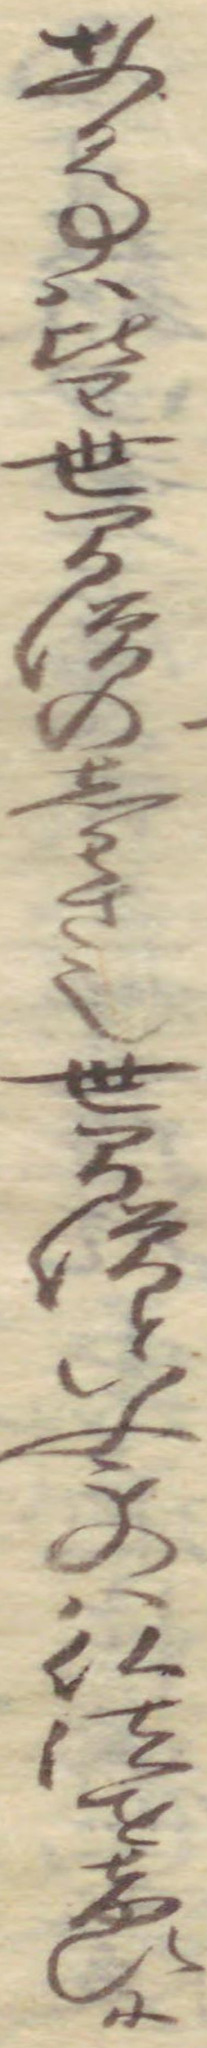なる事は皆世間僧のしわさ也世間僧といふものは仏法を商ひに
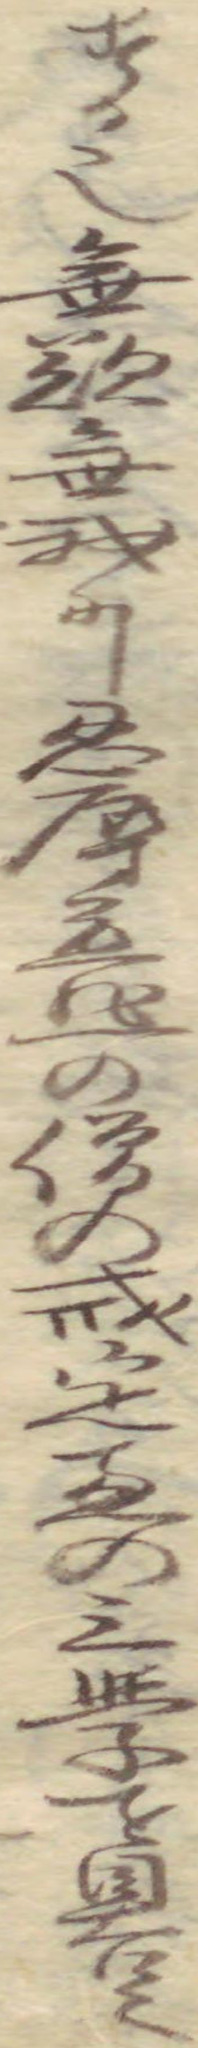する也無欲無我にし忍辱慈悲の僧の戒定恵の三学を具足
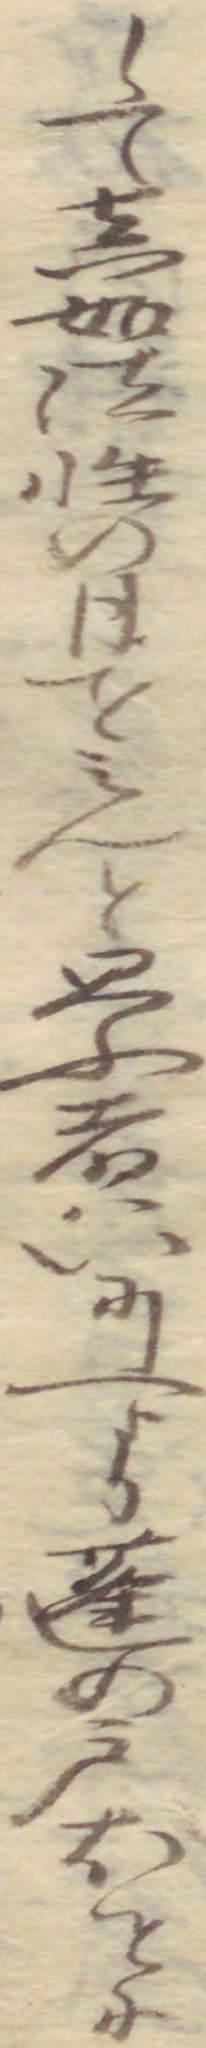して真如仏性の月をみんと思ふ者はいにしへより蓬の戸ほそに
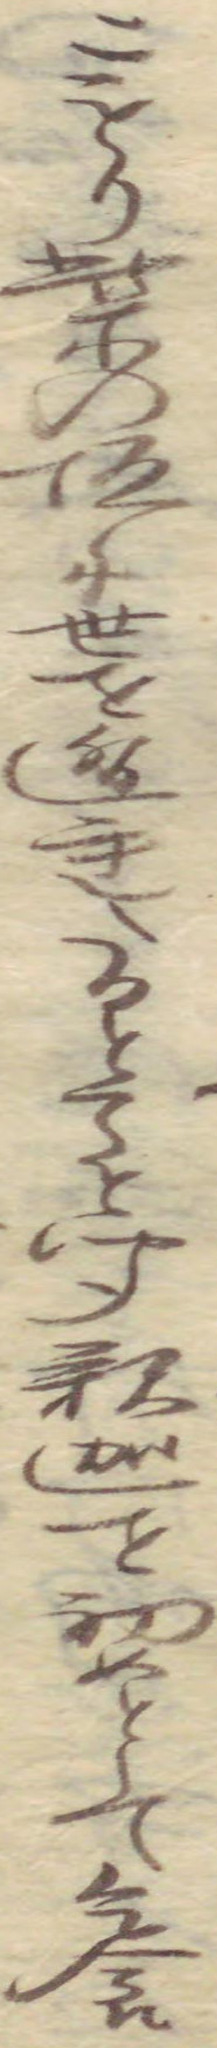こもり柴の垣に世を遁れたるとこそ聞釈迦を初めとして乞食
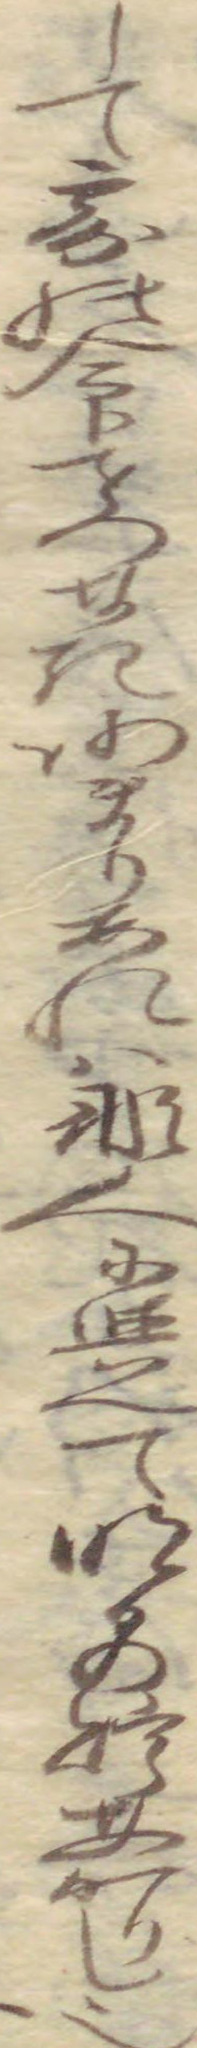して露の命をつなきあまりあれは非人に与へて明日の貯なかりし也
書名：鶯宿雑記. 巻263-264
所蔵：国立国会図書館 National Diet Library, JAPAN
